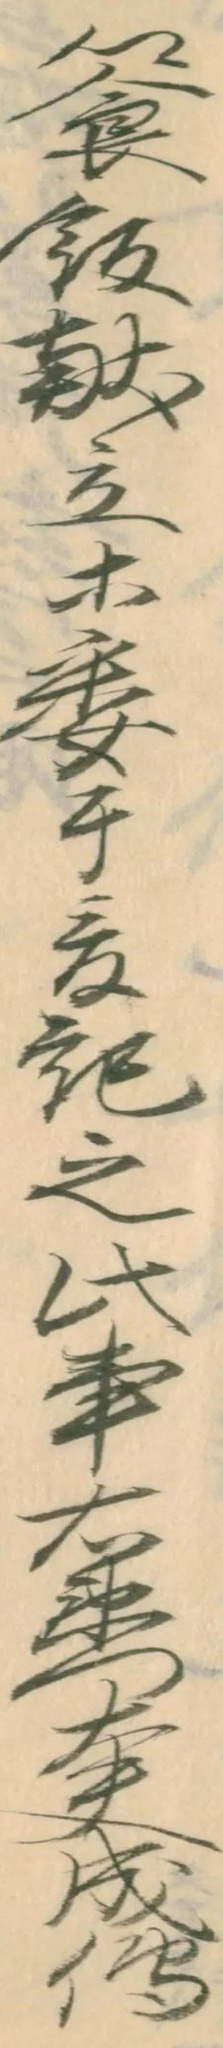饗飯献立等委于爰記之此事右衛門大夫成傅
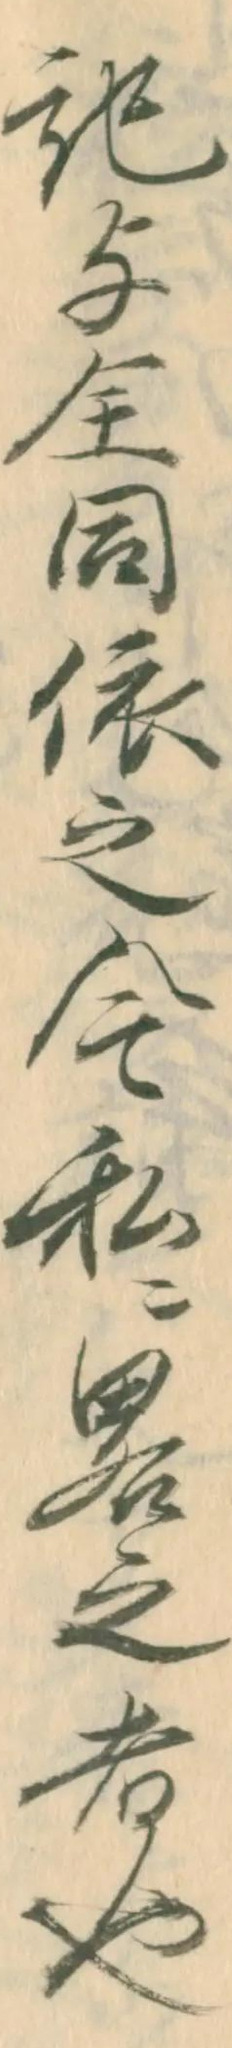記与全同依之令私ニ略之者也
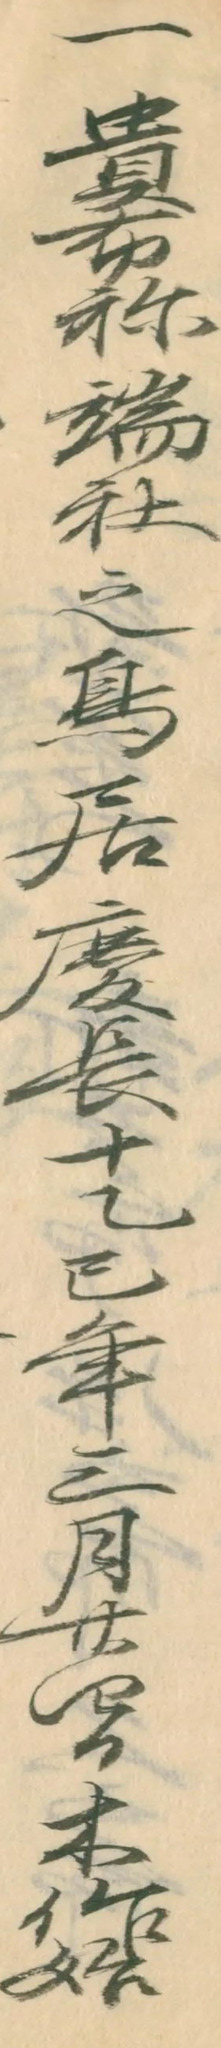一貴布祢端社之鳥居慶長十乙巳年三月廿四日木作始
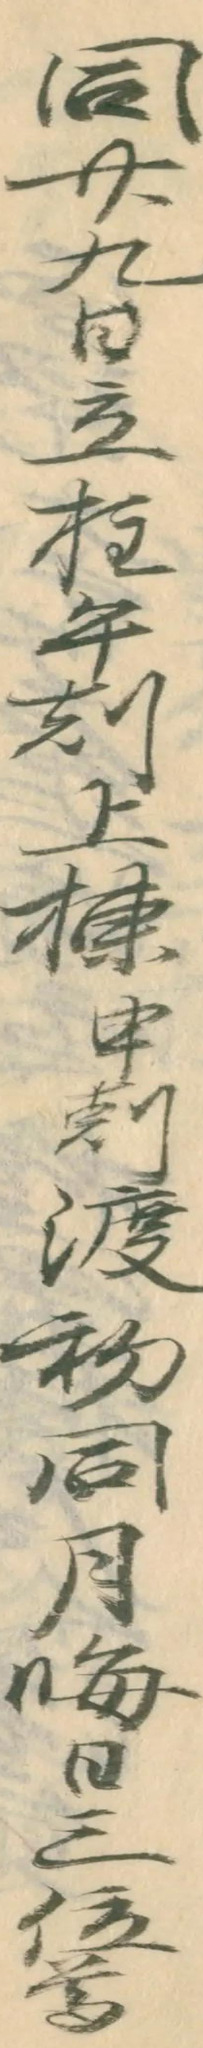同廿九日立柱午刻上棟申刻渡初同月晦日三位尊
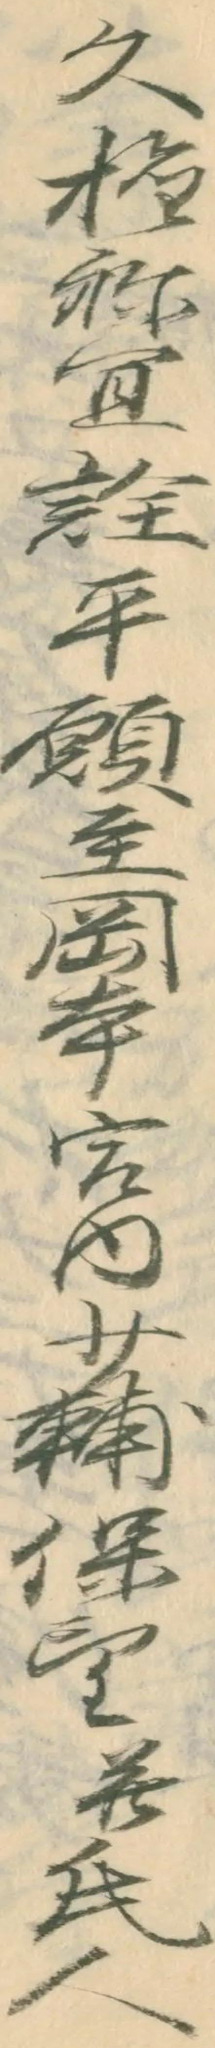久権祢宜詮平願至岡本宮内少輔保望并氏人
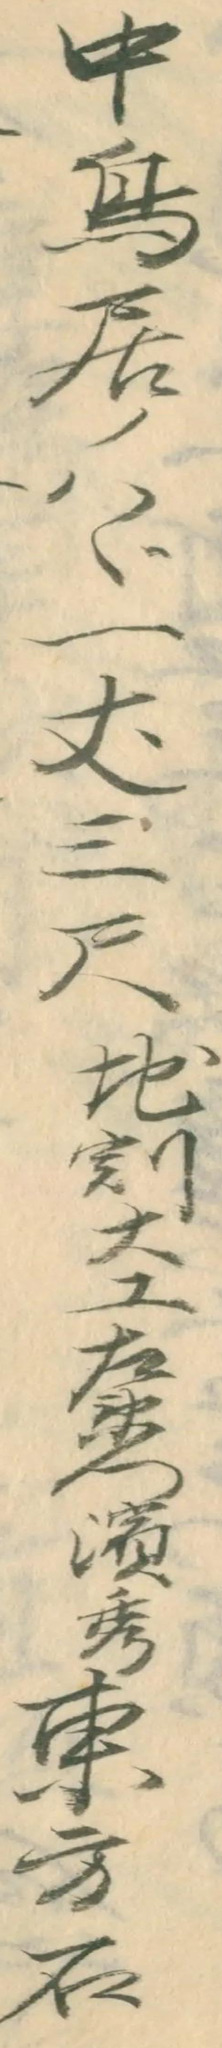中鳥居ノハヾ一丈三尺地割大工左衛門潰秀東方石
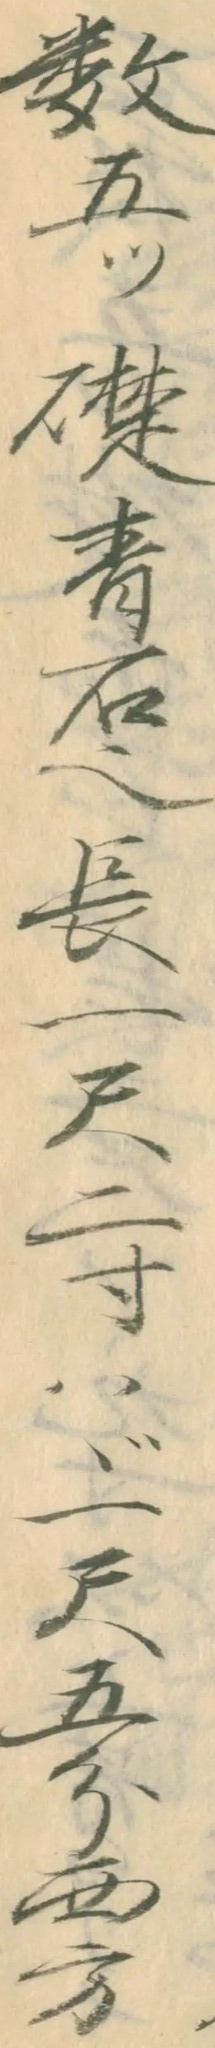数五ツ礎青石也長一尺二寸ハヾ一尺五分西方

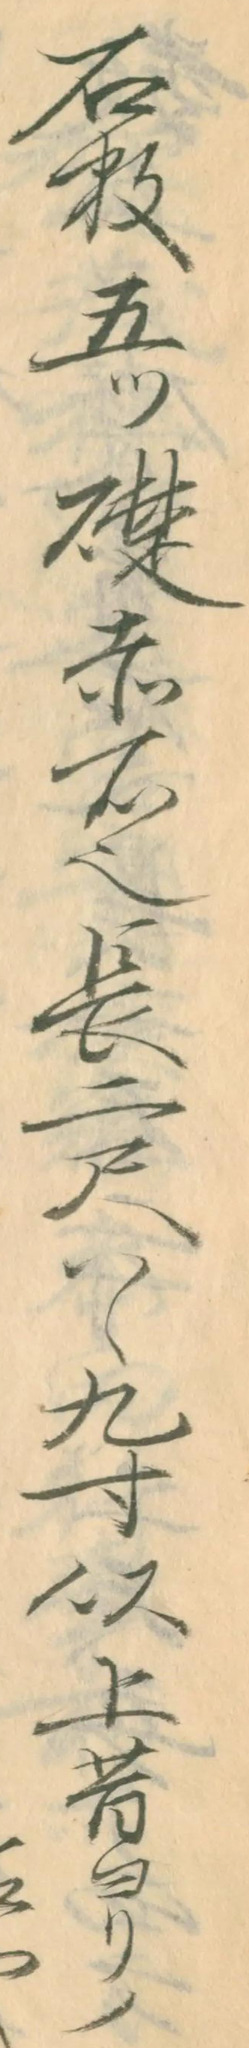石数五ツ礎赤石也長二尺ハヽ九寸以上昔ヨリノ
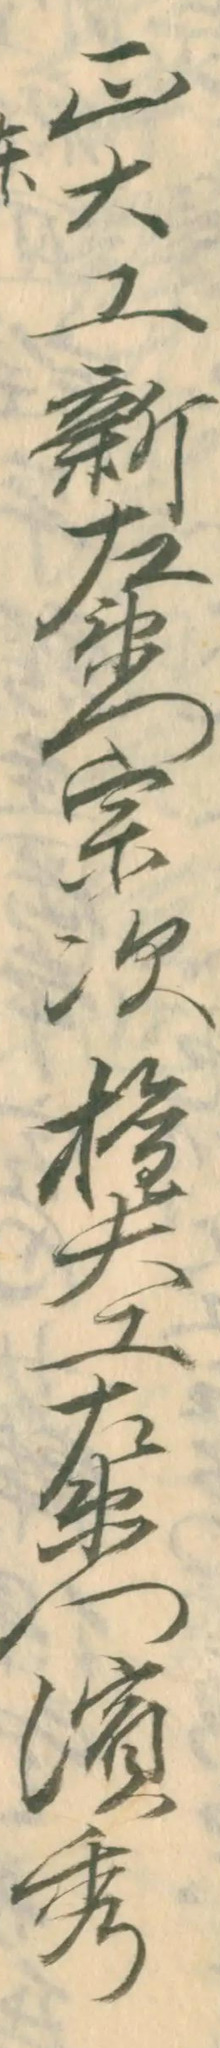正大工新左衛門宗次権大工左衛門濱秀
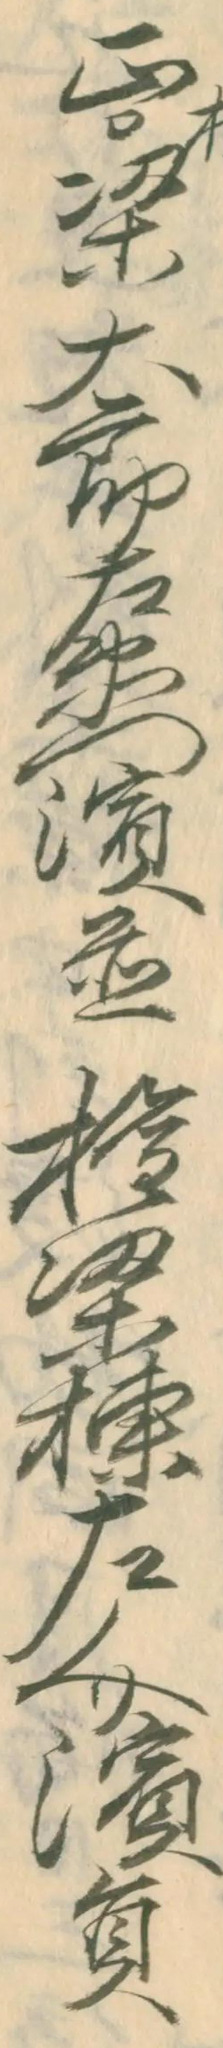正￮梁大郎左衛門濱置権梁棟左介濱員
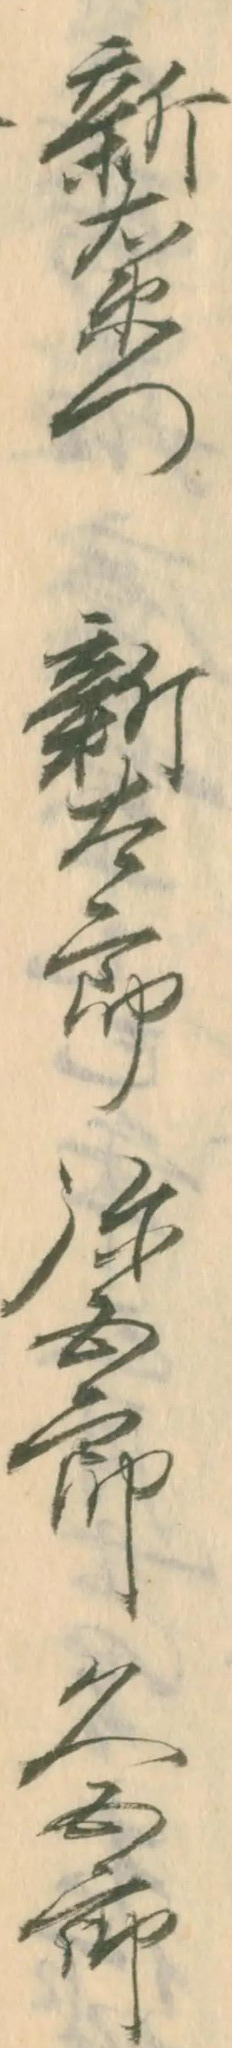新右衛門新太郎弥五郎久五郎
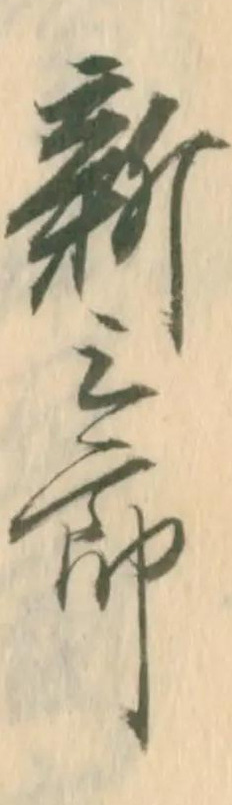新三郎
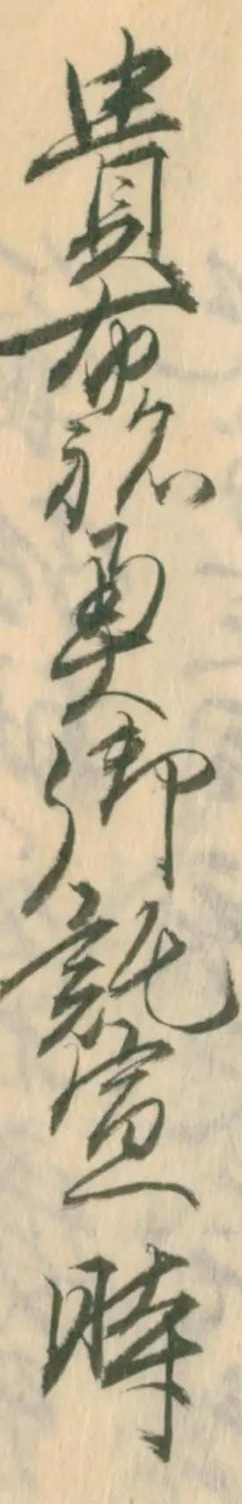一貴布祢奥御託宣時
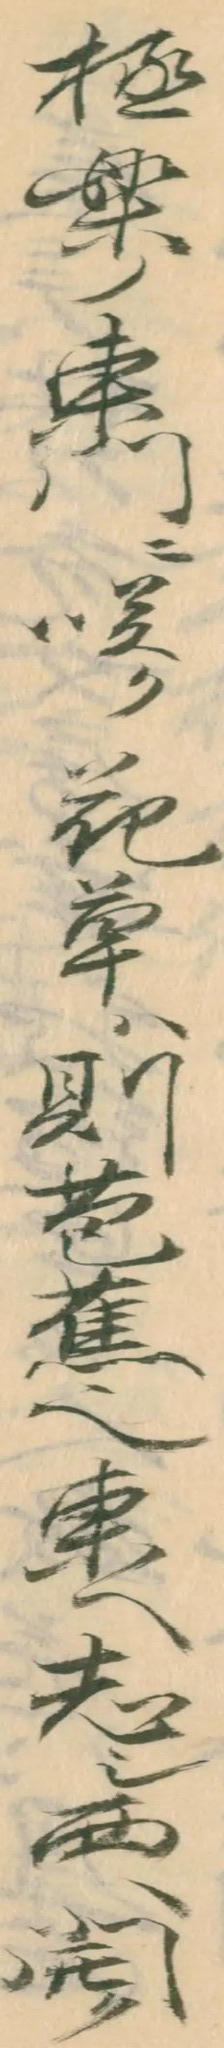極楽ノ東門ニ咲ク花草ハ則芭蕉也東ヘ志シ西ヘ開ク
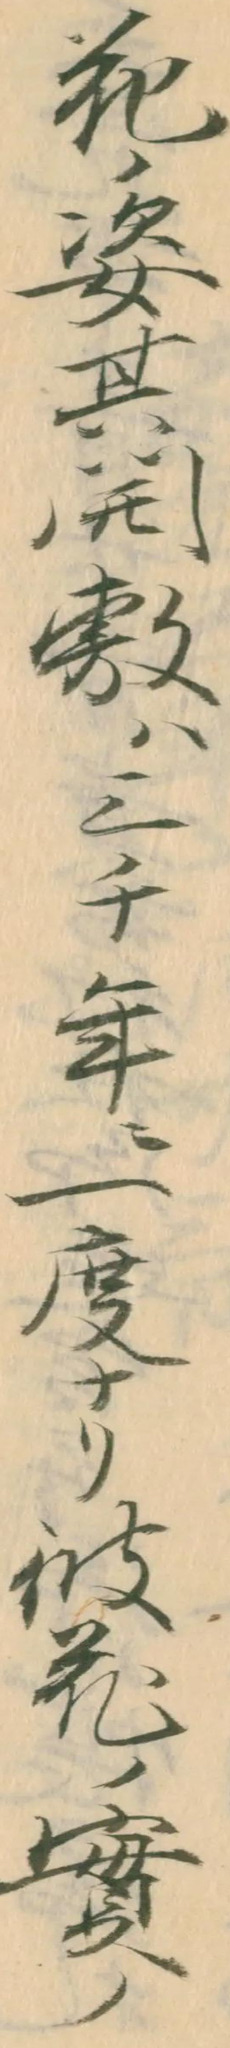花ノ姿其開敷ハ三千年ニ一度ナリ彼花ノ実ノ
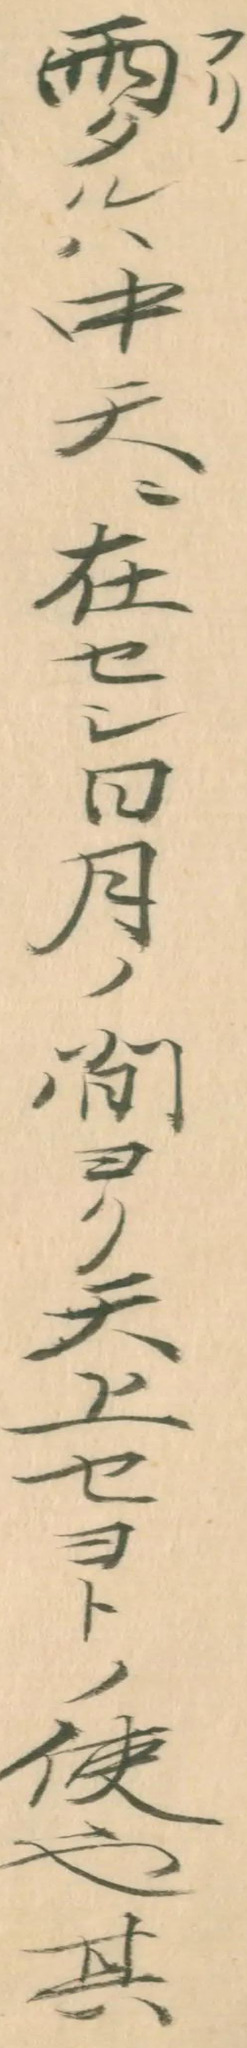雨タルハ中天ニ在セシ日月ノ間ヨリ天上セヨトノ使也其
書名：賀茂社記録. 第15冊
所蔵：国立国会図書館 National Diet Library, JAPAN
